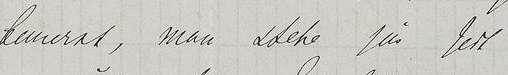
bemerkt, man stehe zur Zeit
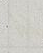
den
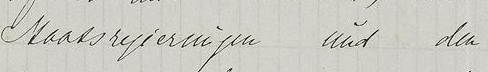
Staatsregierungen und den
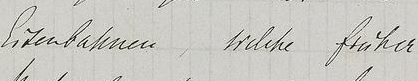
Eisenbahnen, welche früher
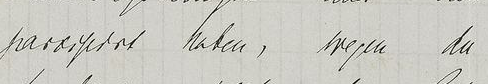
parcipirt haben, wegen der
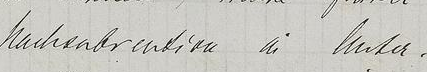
Nachsubvention in Unter-
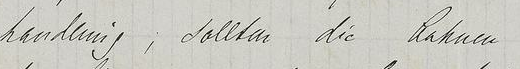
handlung; sollten die Bahnen
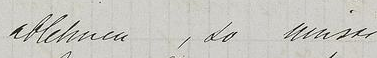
ablehnen, so müsse
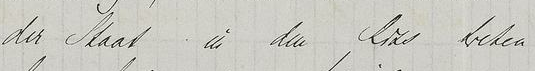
der Staat in den Riss treten.
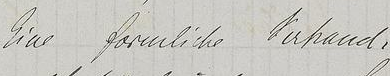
Eine förmliche Verhand-
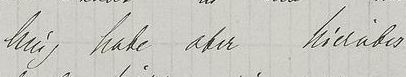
lung habe aber hierüber
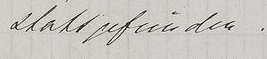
stattgefunden.
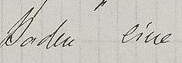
Baden eine
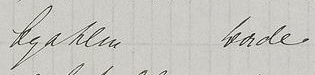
bezahlen werde;
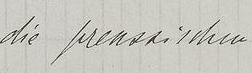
die preussischen
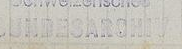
anbetreffe, so sei
